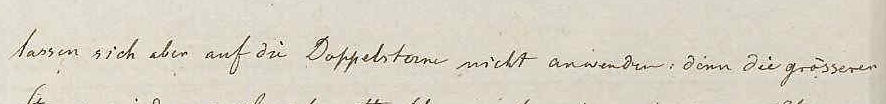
lassen sich aber auf die Doppelsterne nicht anwenden: denn die grösseren
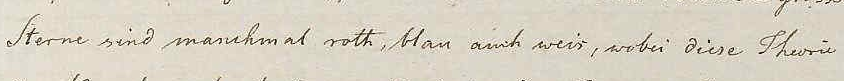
Sterne sind manchmal roth, blau auch weis, wobei diese Theorie
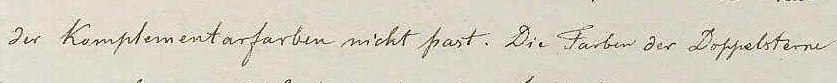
der Komplementarfarben nicht past. Die Farben der Doppelsterne
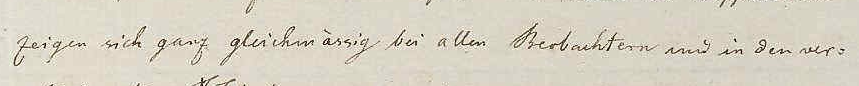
zeigen sich ganz gleichmässig bei allen Beobachtern und in den ver-
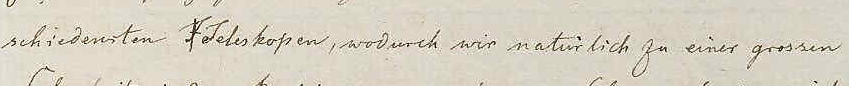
schiedensten FTeleskopen, wodurch wir natürlich zu einer grossen
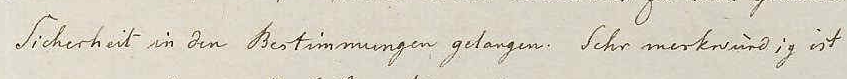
Sicherheit in den Bestimmungen gelangen. Sehr merkwürdig ist
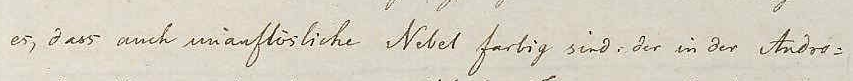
es, dass auch unauflösliche Nebel farbig sind: der in der Andro-
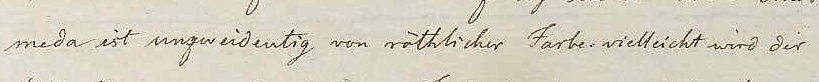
meda ist unzweideutig von röthlicher Farbe: vielleicht wird der
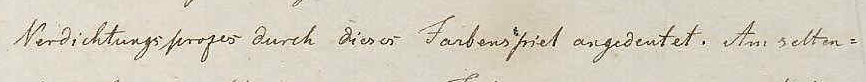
Verdichtungsprozes durch dieses Farbenspiel angedeutet. Am selten-
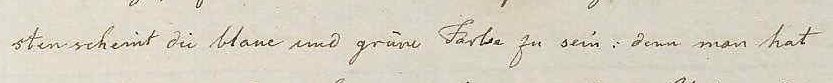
sten scheint die blaue und grüne Farbe zu sein: denn man hat
